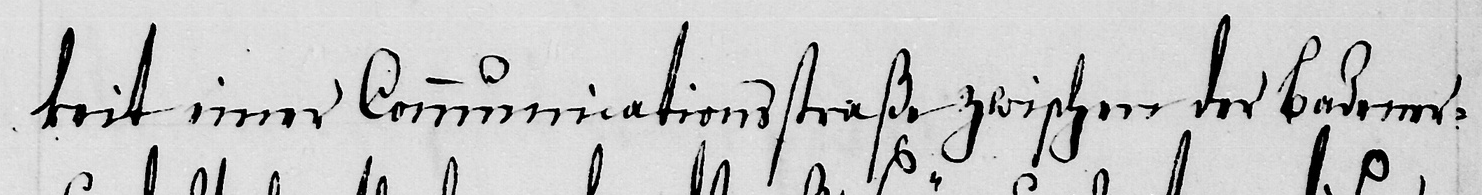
keit einer Communicationsstraße der Badener-
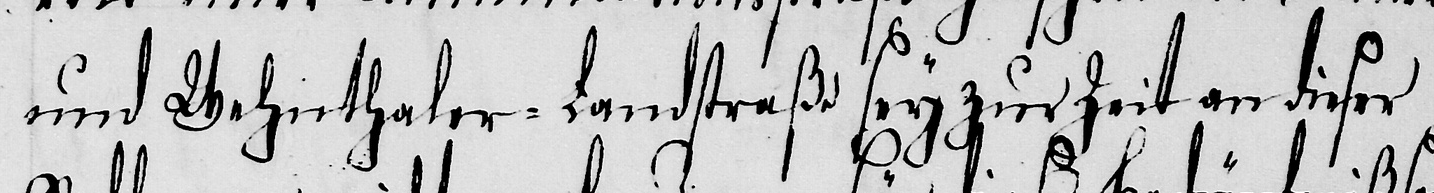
und Wehnthaler-Landstraße sey zur Zeit an dieser
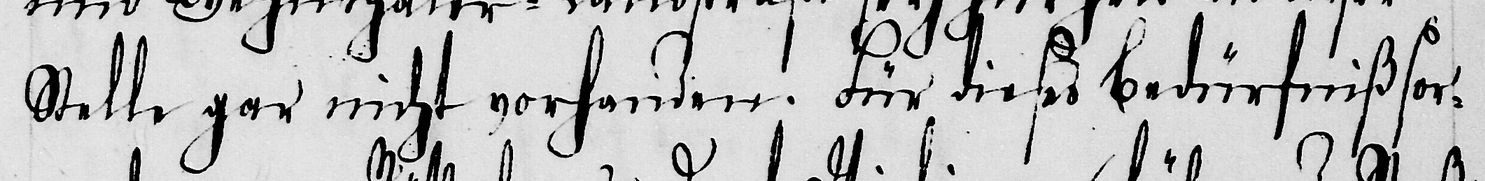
Stelle gar nicht vorhanden. Für dieses Bedürfniß sor¬
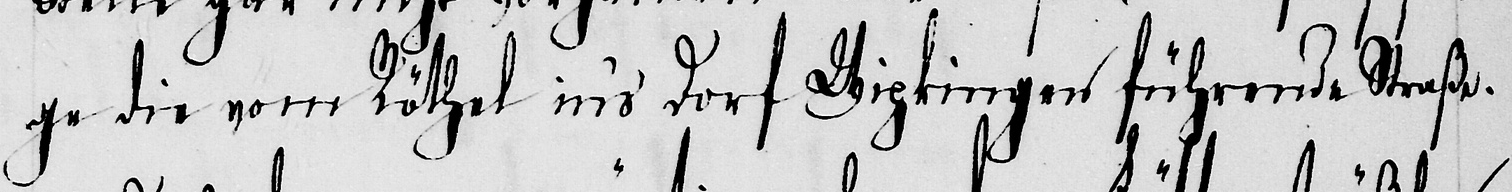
ge die vom Röthel ins Dorf Wipkingen führende Straße.
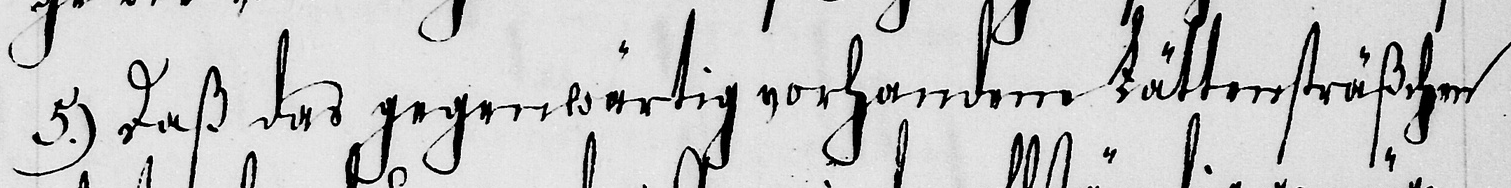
5.) Daß das gegenwärtig vorhandene Lättensträßchen
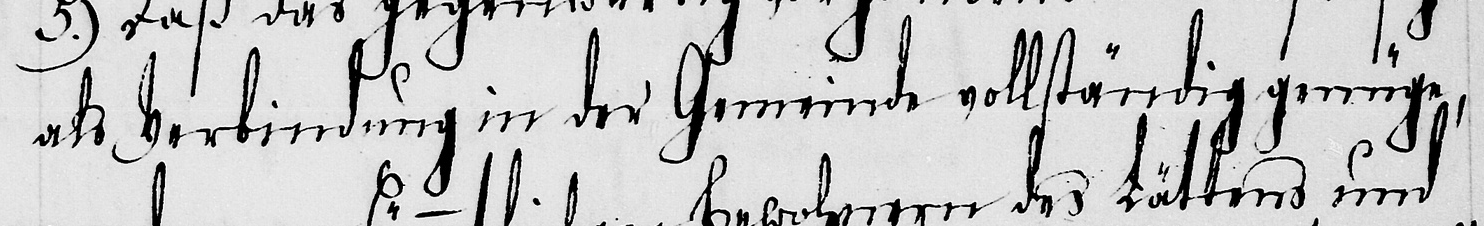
als Verbindung in der Gemeinde vollständig genüge,
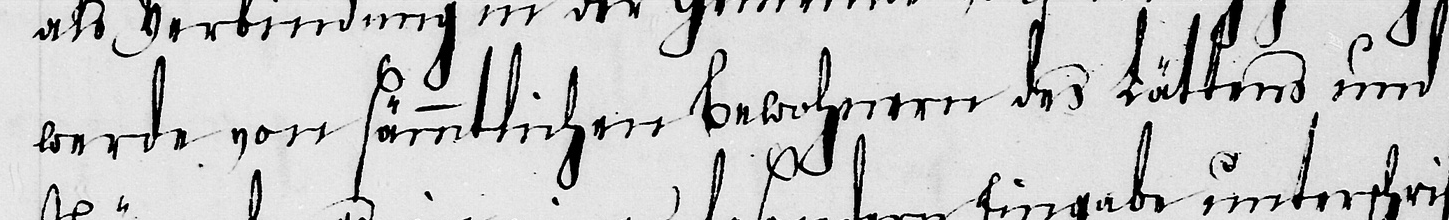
werde von sämmtlichen Bewohnern des Lättens und
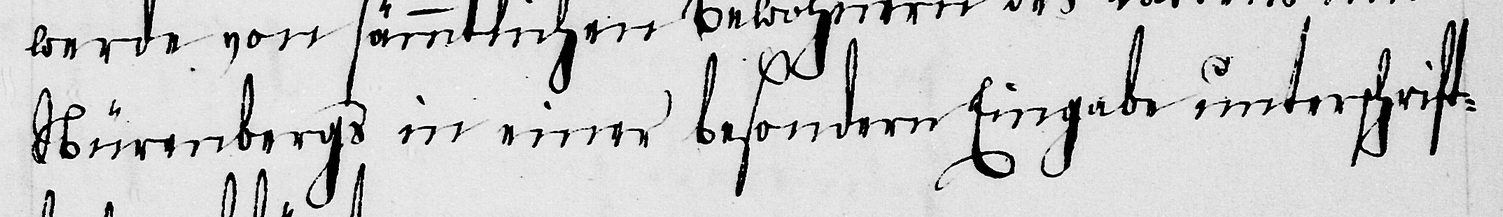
Nürenbergs in einer besondern Eingabe unterschrift¬
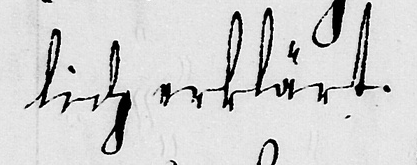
lich erklärt.
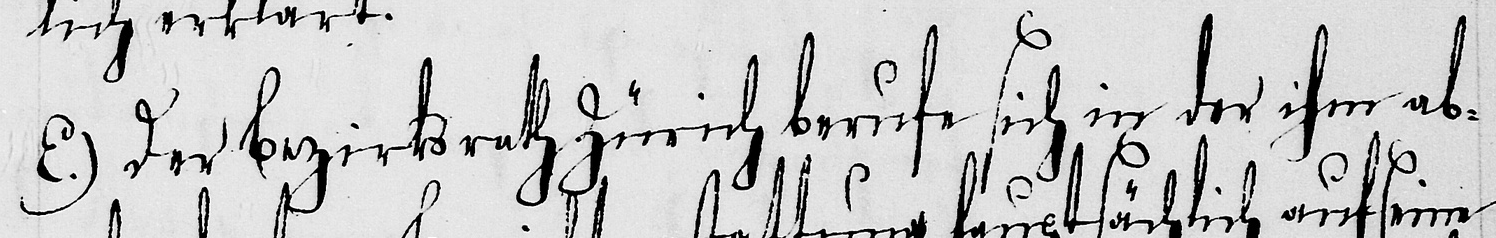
E.) Der Bezirksrath Zürich berufe sich in der ihm ab¬
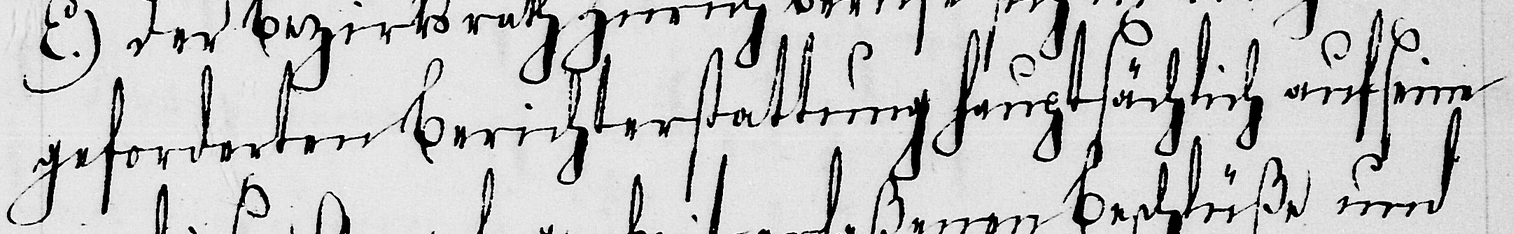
geforderten Berichterstattung hauptsächlich auf se¬
